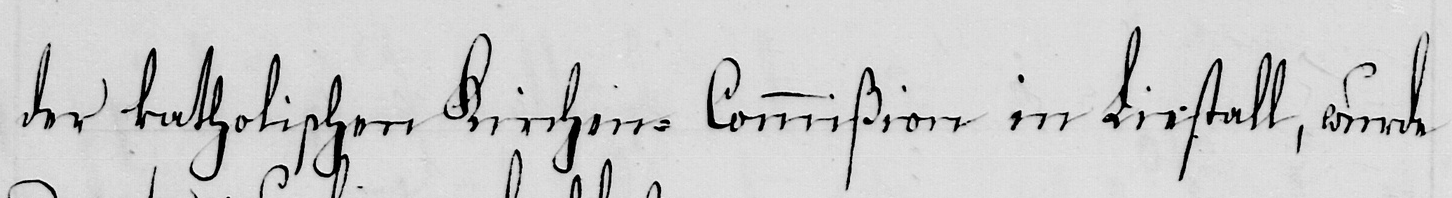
der katholischen Kirchen-Commißion in Liestall, wurde
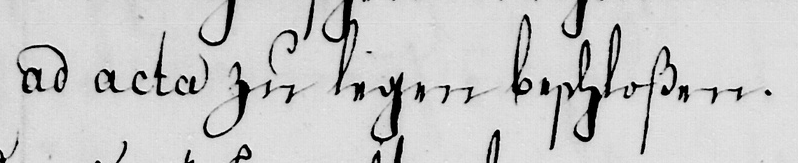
ad acta zu legen beschloßen.
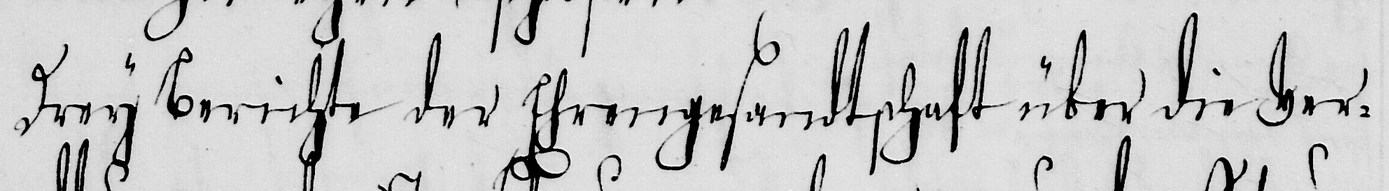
Drey Berichte der Ehrengesandtschaft über die Ver¬
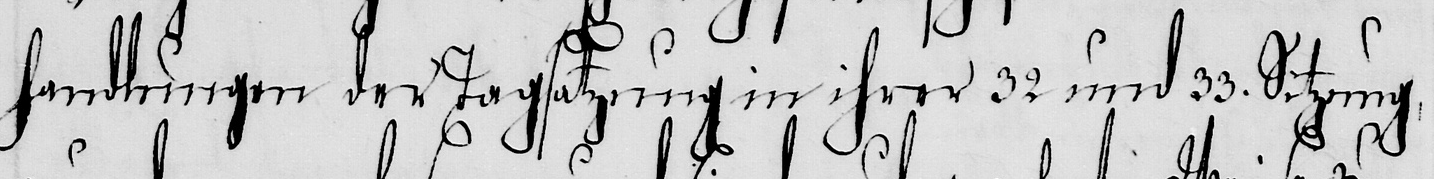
handlungen der Tagsatzung in ihrer 32 und 33. Sitzung,
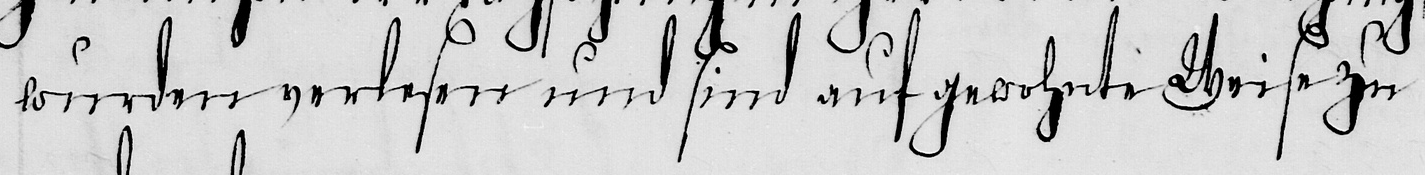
wurden verlesen und sind auf gewohnte Weise zu
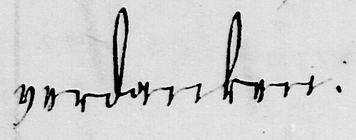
verdanken.
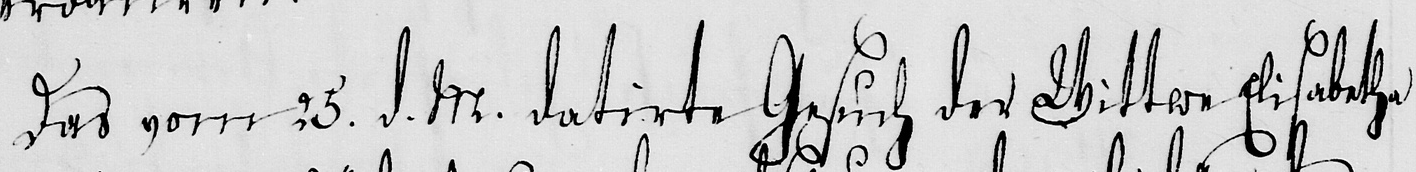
Das vom 25. d. M. datirte Gesuch der Wittwe Elisabetha
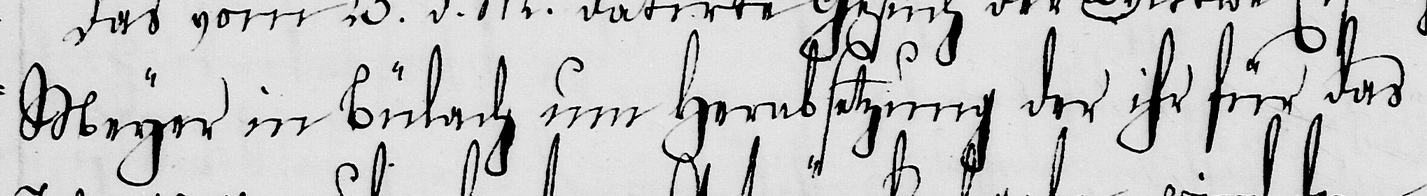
Meyer in Bülach um Herabsetzung der ihr für das
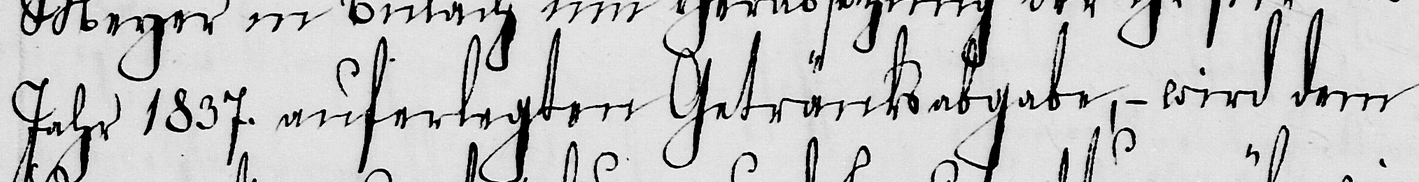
Jahr 1837. auferlegten Getränksabgabe, – wird dem
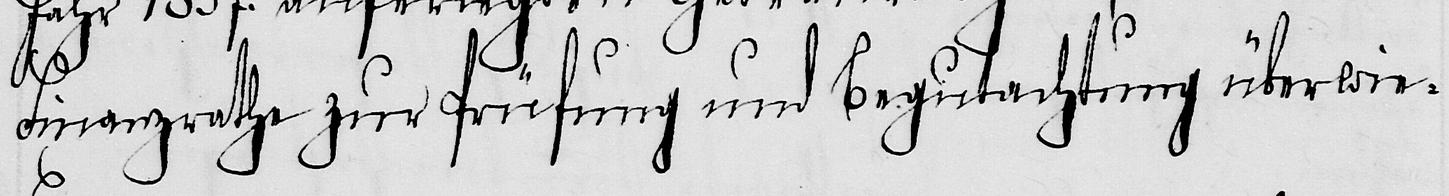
Finanzrathe zur Prüfung und Begutachtung überwie¬
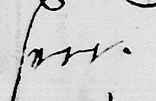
sen.
